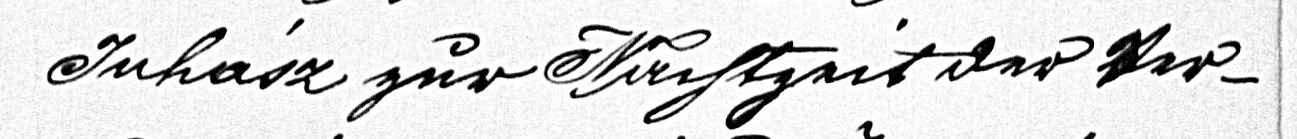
Inhász zur Nachtzeit der Ver¬
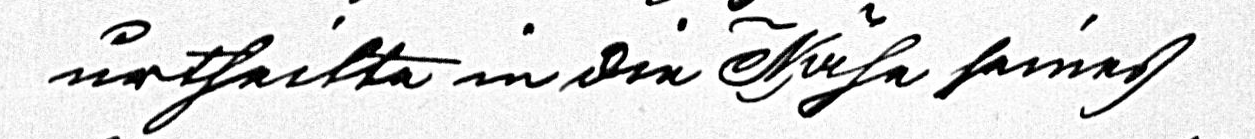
urtheilte in die Nähe seines
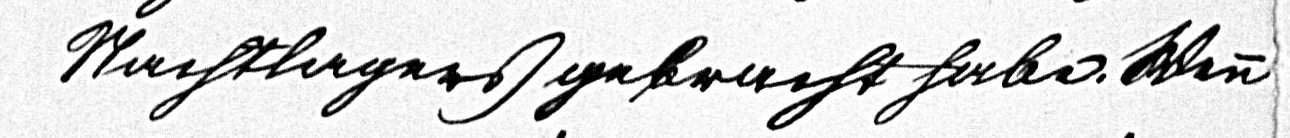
Nachtlagers gebracht habe. Wenn
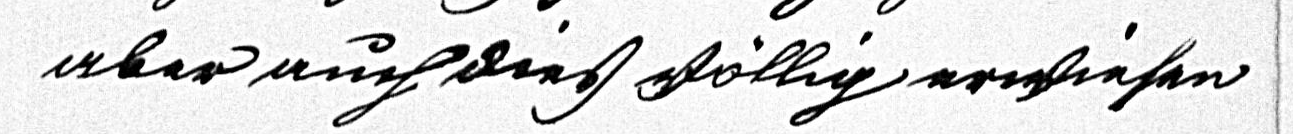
aber auch dies völlig erwiesen
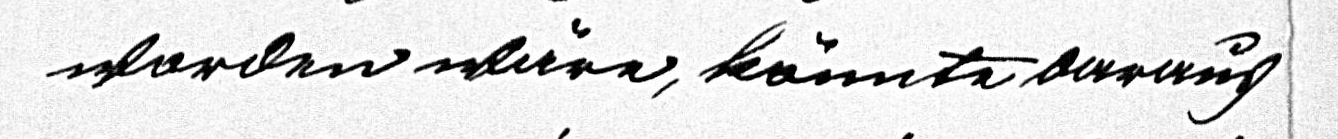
worden wäre, könnte daraus
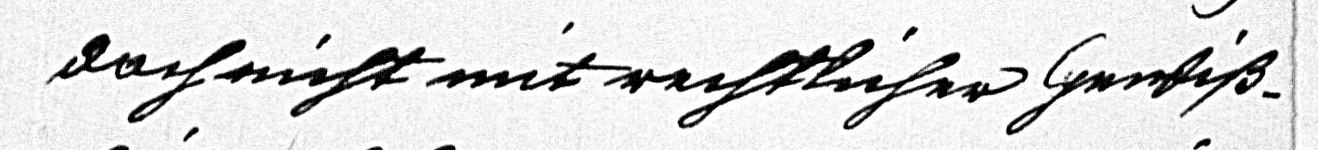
doch nicht mit rechtlicher Gewiß¬
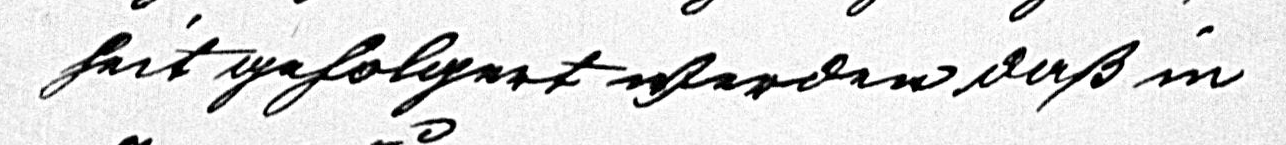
heit gefolgert werden daß in
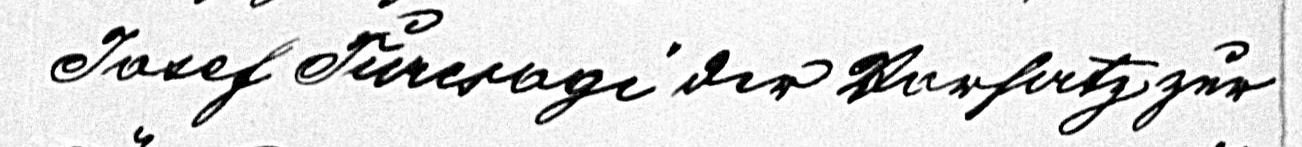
Josef Turcsogi der Vorsatz zur
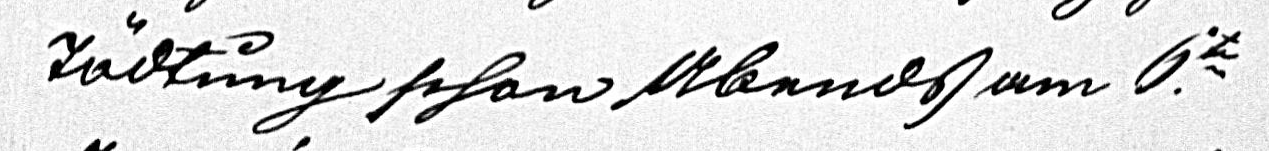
Tödtung schon Abends am 6.ten
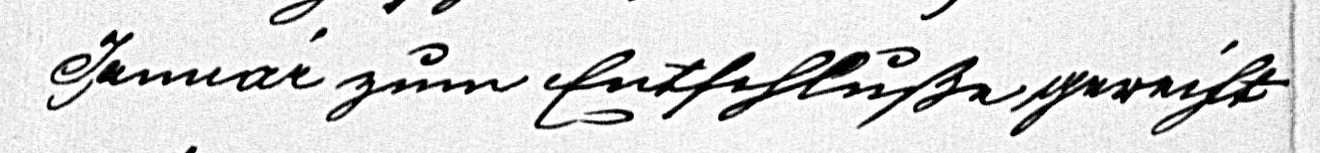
Január zum Entschluße gereift
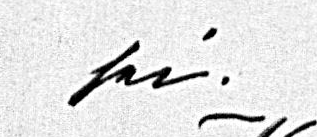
sei.
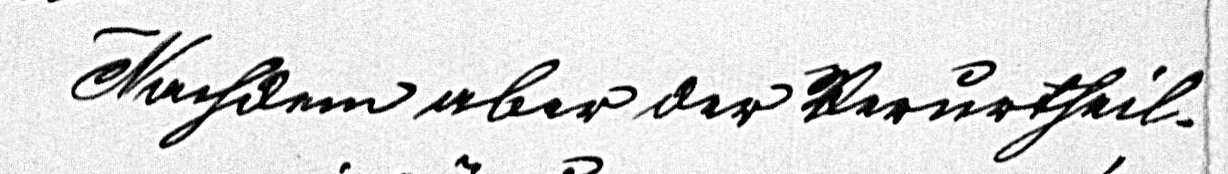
Nachdem aber der Verurtheil¬
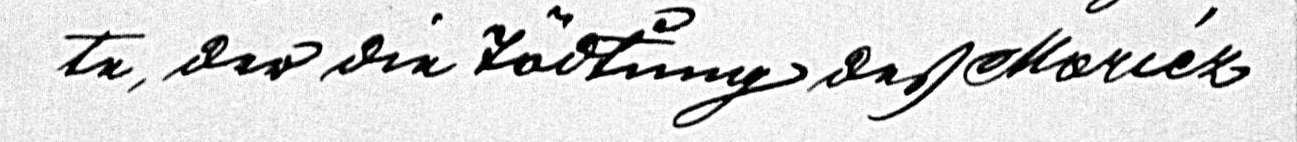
te, der die Tödtung des Morcéz
